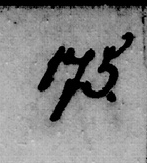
11.
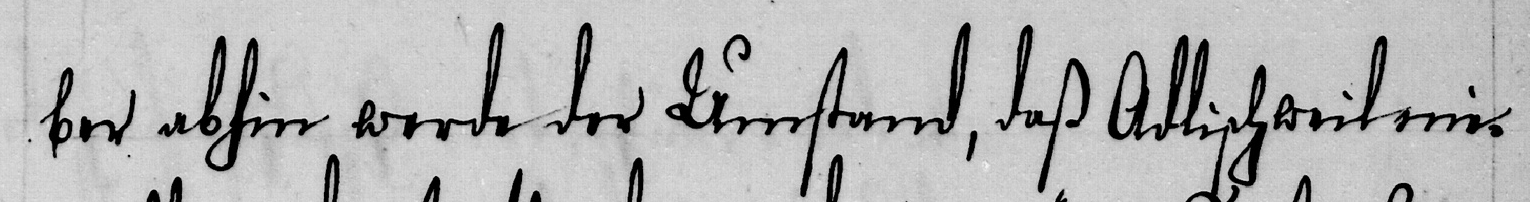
ber abhin werde der Umstand, daß Adlischweil nie¬
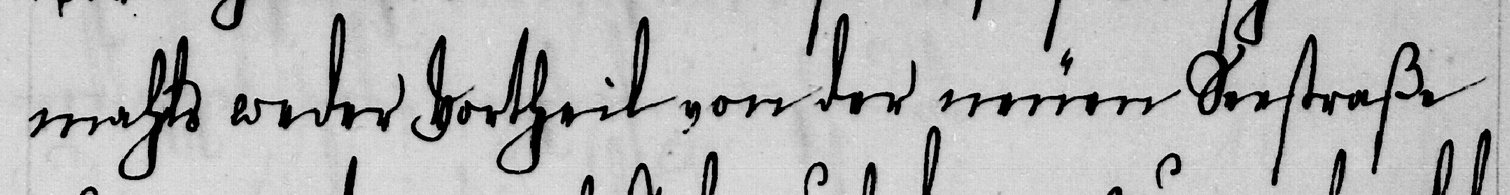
mahls weder Vortheil von der neuen Seestraße
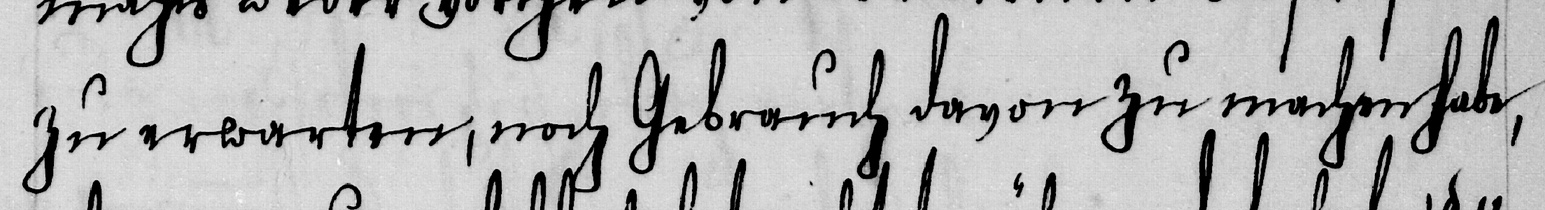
zu erwarten, noch Gebrauch davon zu machen habe,
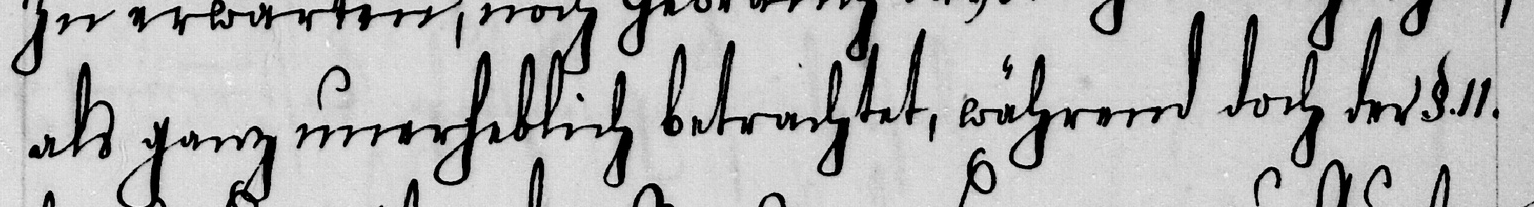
als ganz unerheblich betrachtet, während doch der §.
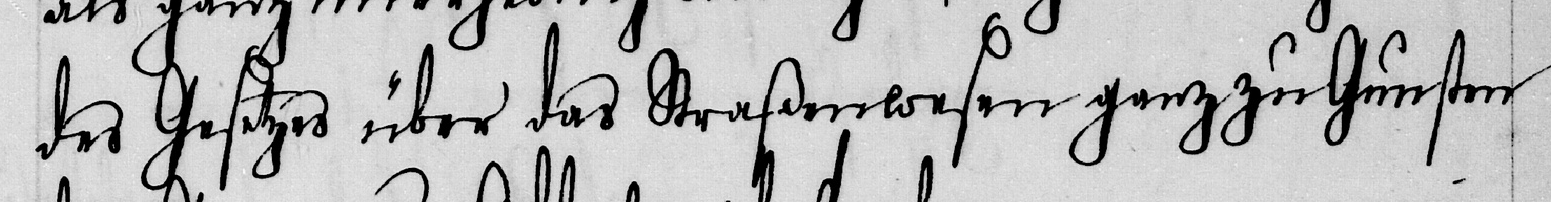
des Gesetzes über das Straßenwesen ganz zu Gunsten
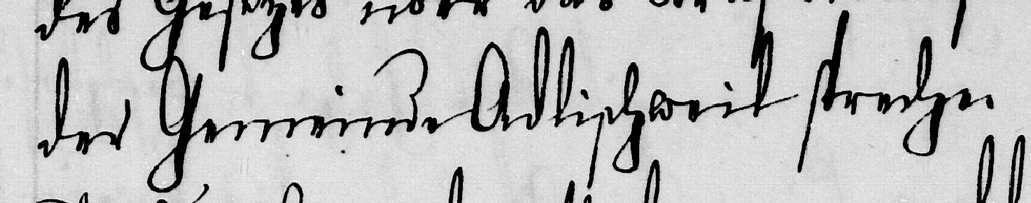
der Gemeinde Adlischweil spreche.
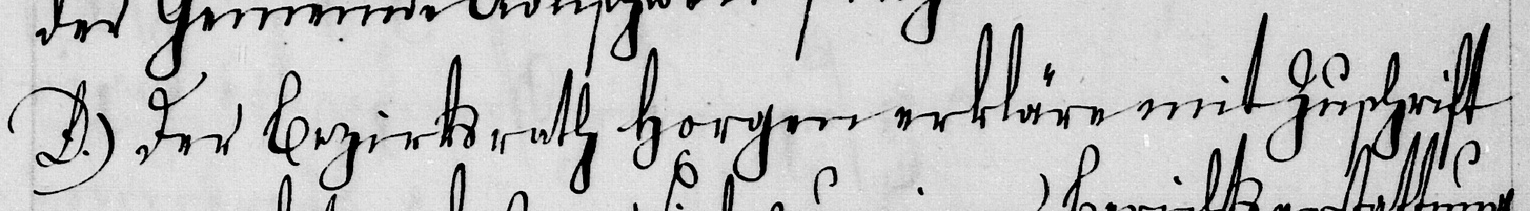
D.) Der Bezirksrath Horgen erkläre mit Zuschrift
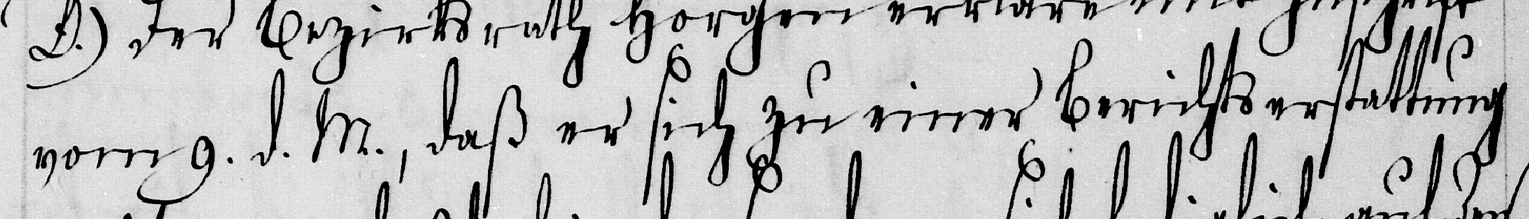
vom 9. d. M., daß er sich zu einer Berichtserstattung
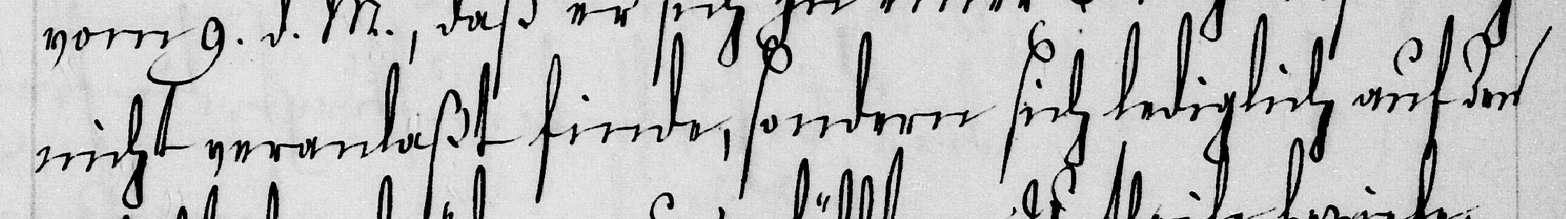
nicht veranlaßt finde, sondern sich lediglich auf den
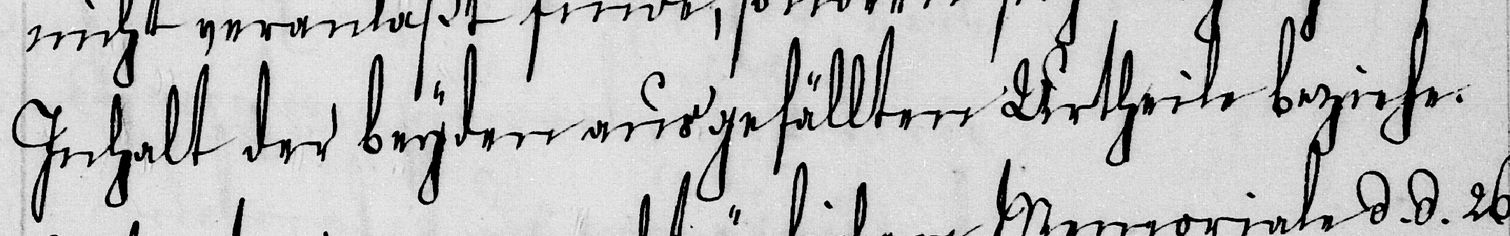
Inhalt der beyden ausgefällten Urtheile beziehe.
